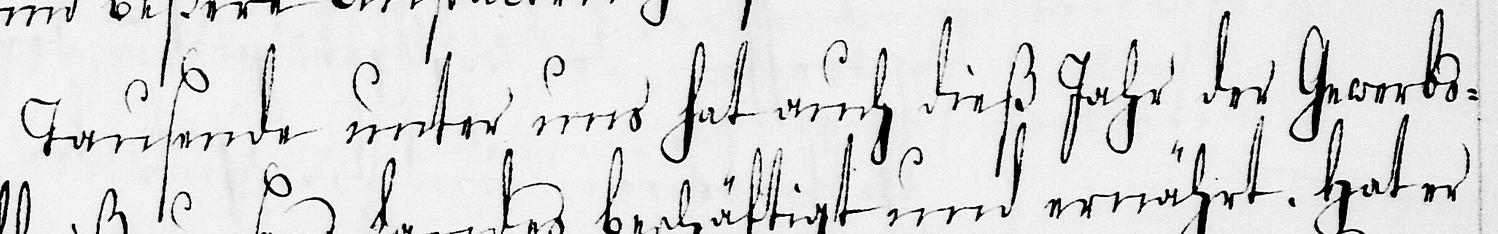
Tausende unter uns hat auch dieß Jahr der Gewerbs¬
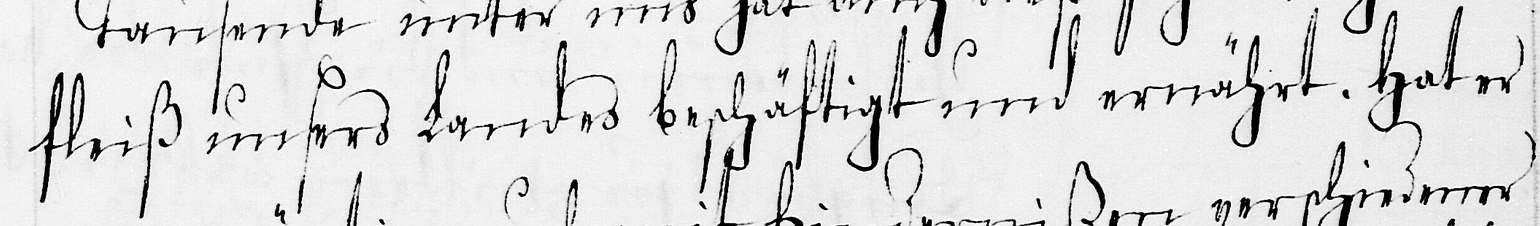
fleiß unsers Landes beschäftigt und ernährt. Hat er
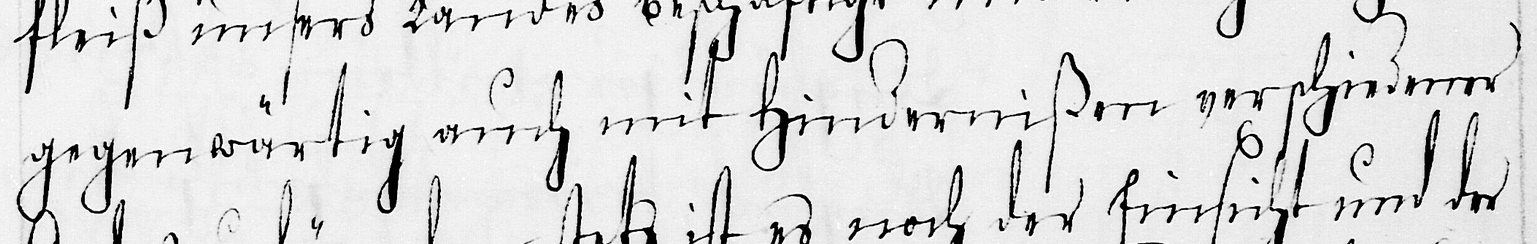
gegenwärtig auch mit Hindernißen verschiedener
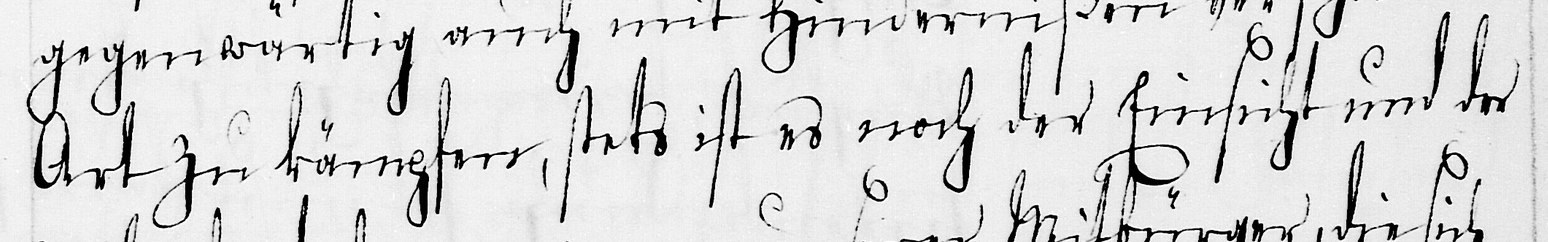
Art zu kämpfen, stets ist es noch der Einsicht und der
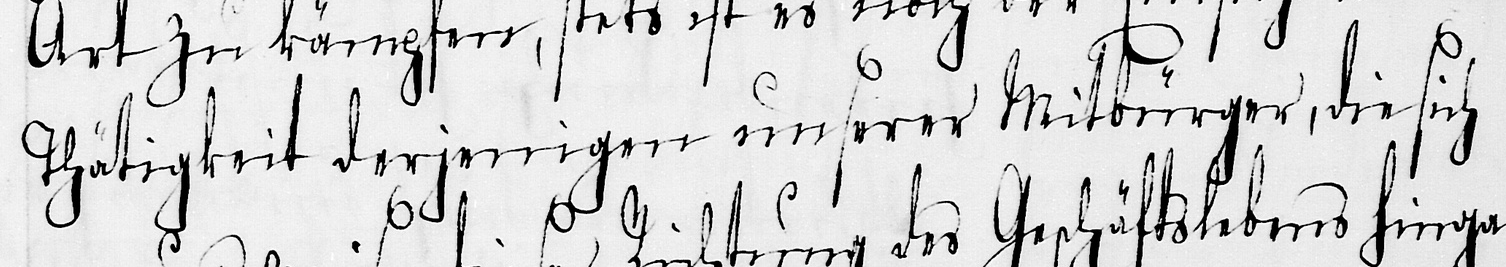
Thätigkeit derjenigen unserer Mitbürger, die sich
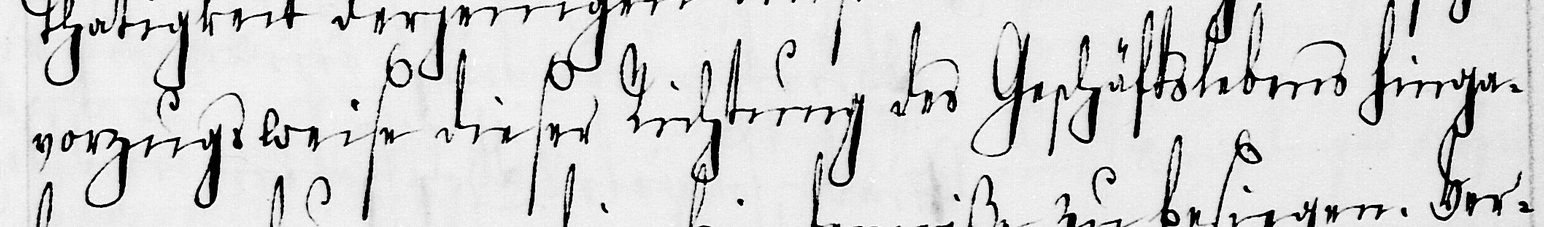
vorzugsweise dieser Richtung des Geschäftslebens hinga¬
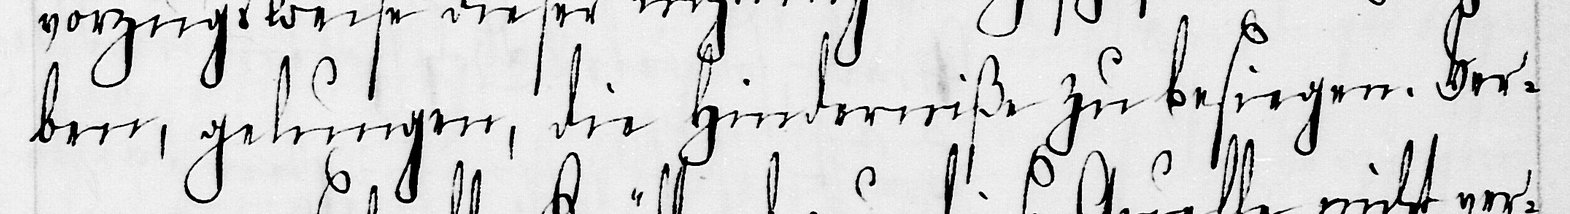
ben, gelungen, die Hinderniße zu besiegen. Ver¬
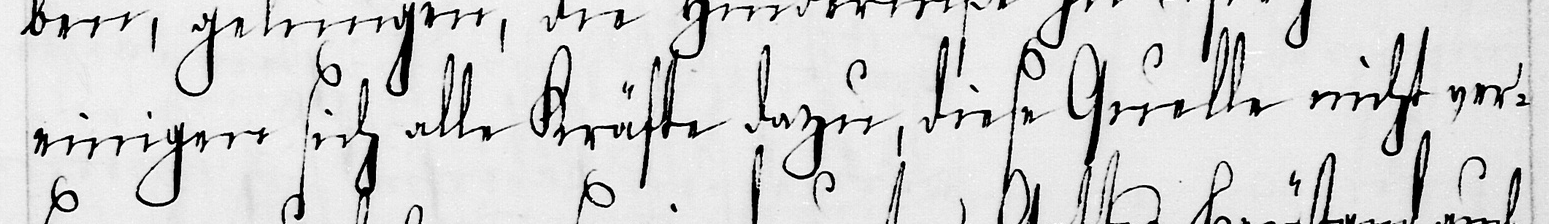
einigen sich alle Kräfte dazu, diese Quelle nicht ver¬
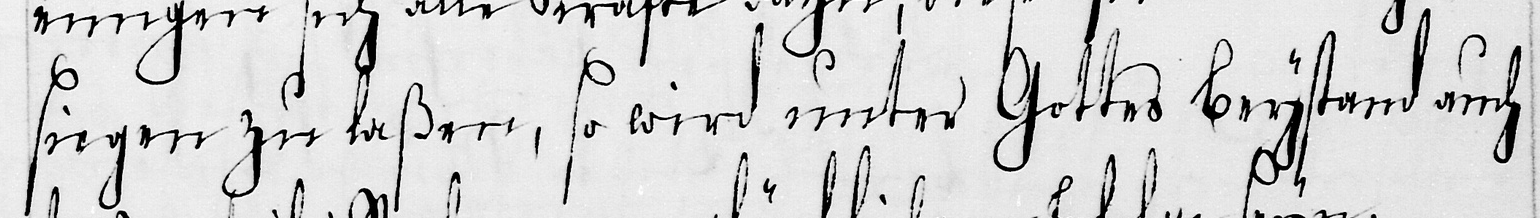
siegen zu laßen, so wird unter Gottes Beystand auch
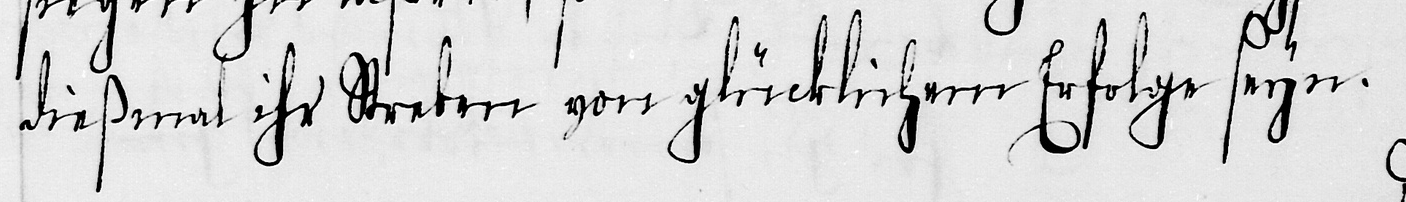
dießmal ihr Streben von glücklichem Erfolge seyn.
